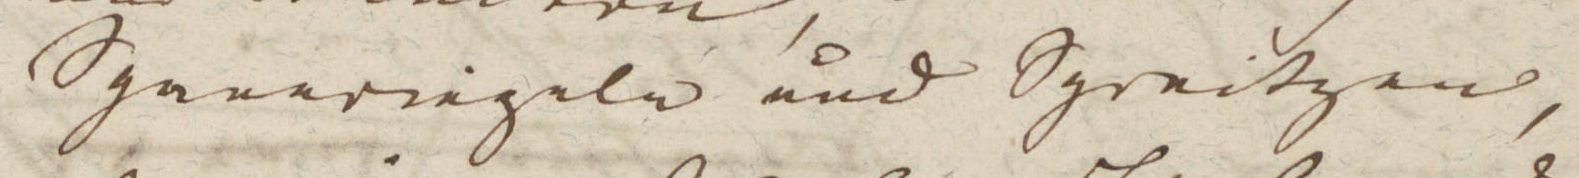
Spannriegeln und Spreitzen,
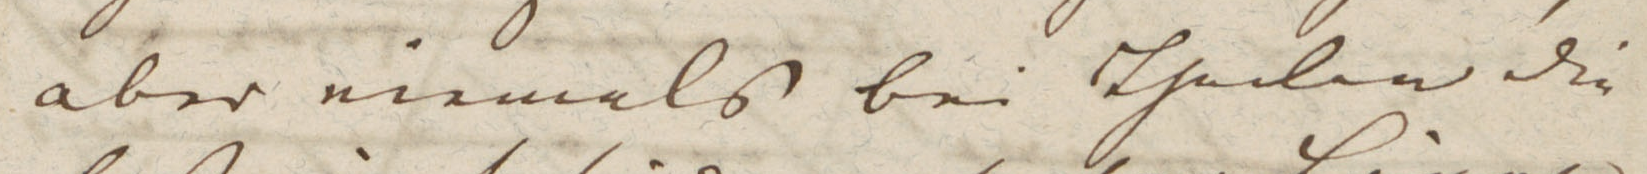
aber niemals bei Theilen die
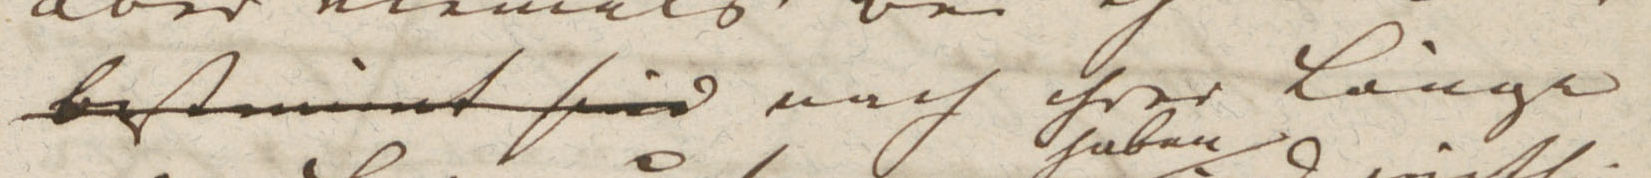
bestimmt sind nach ihrer Länge
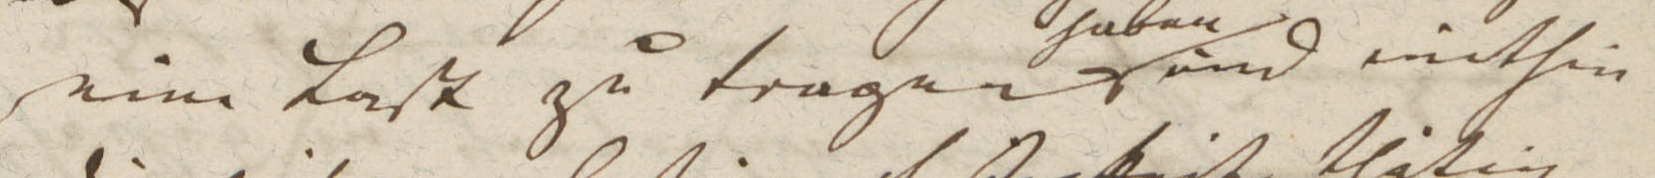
eine Last zu tragen haben und mithin
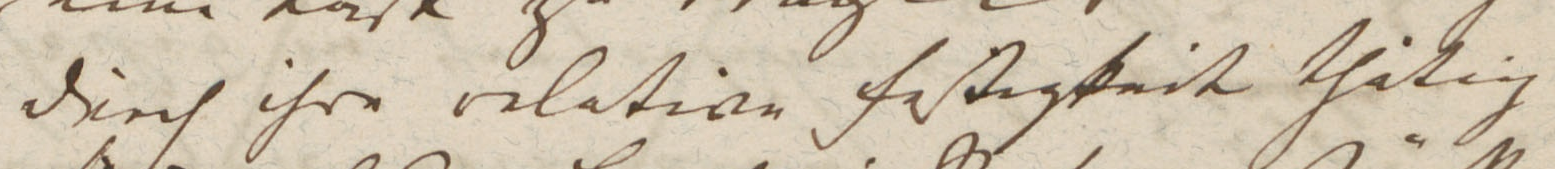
durch ihre relative Festigkeit thätig
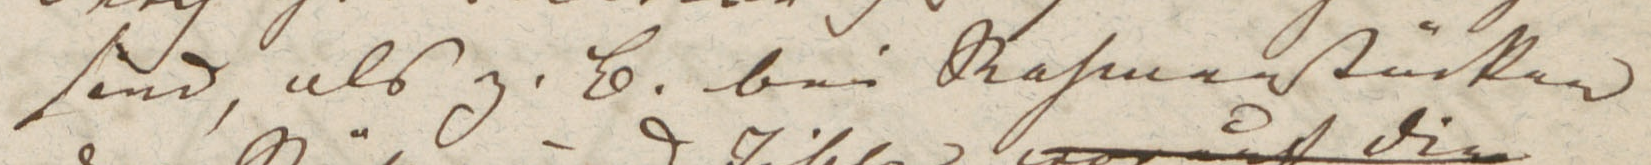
sind, als z. B. bei Rahmenstücken
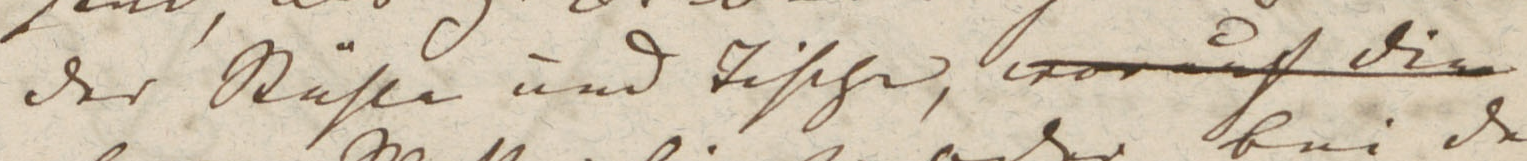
der Stühle und Tische, worauf die
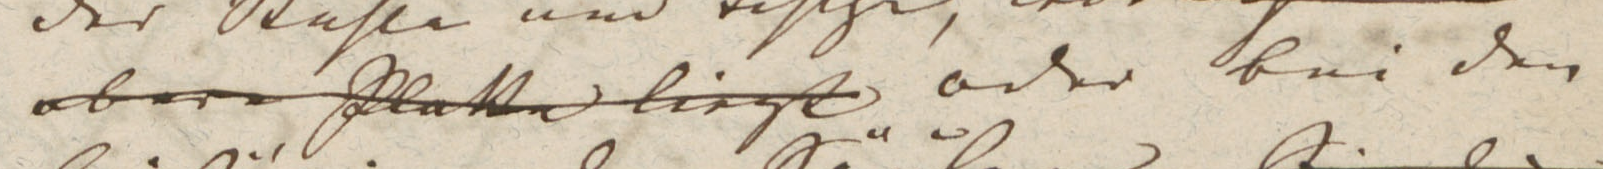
obere Platte liegt oder bei den
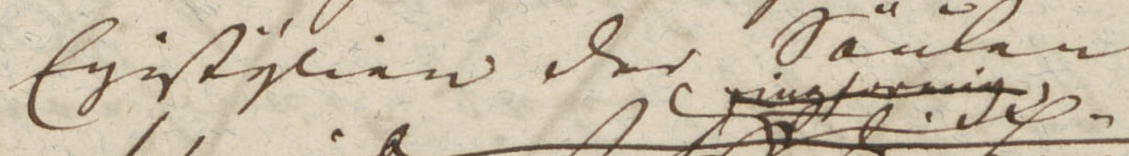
Epystylien der Säulen. Sie durch-
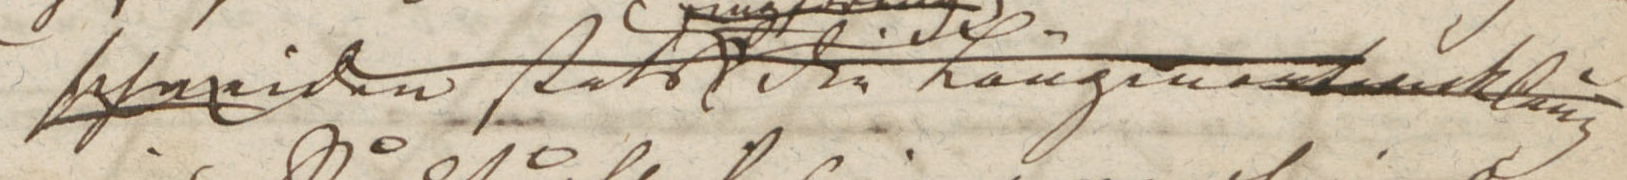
schneiden stets ringformig die Längenentwicklung
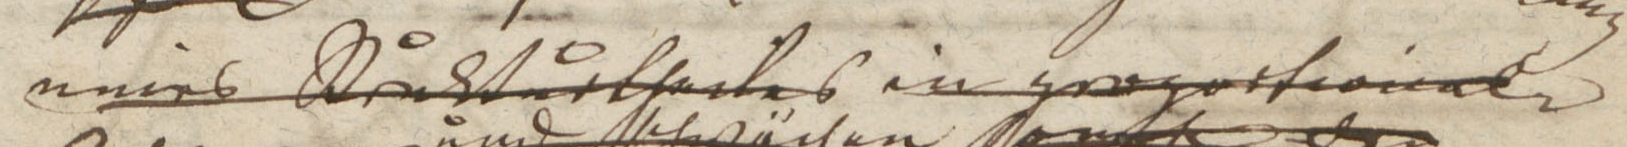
eines Strukturtheiles in proportionale
